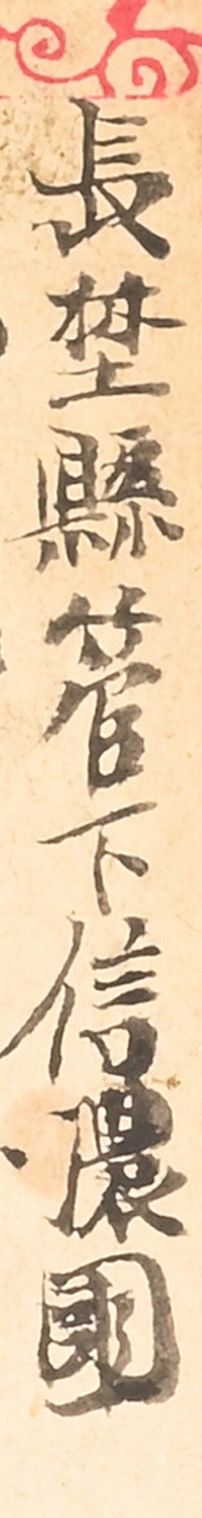長埜県管下信濃国
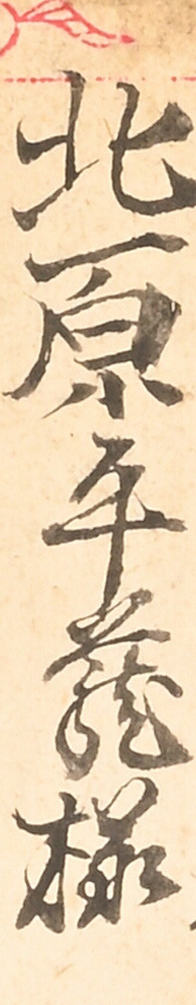北原平蔵様
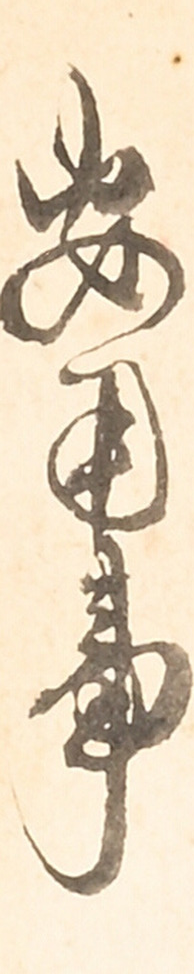安用事

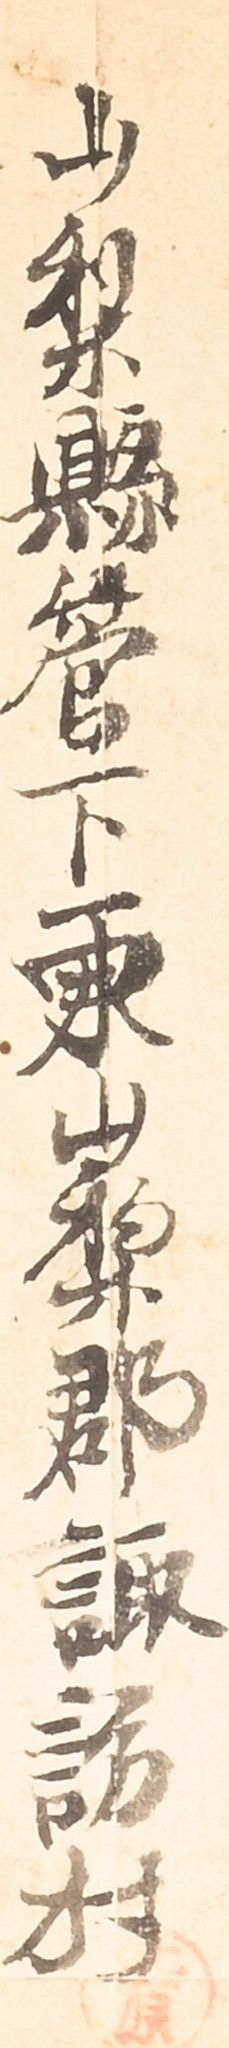乄山梨県管下東山梨郡諏訪村㊞

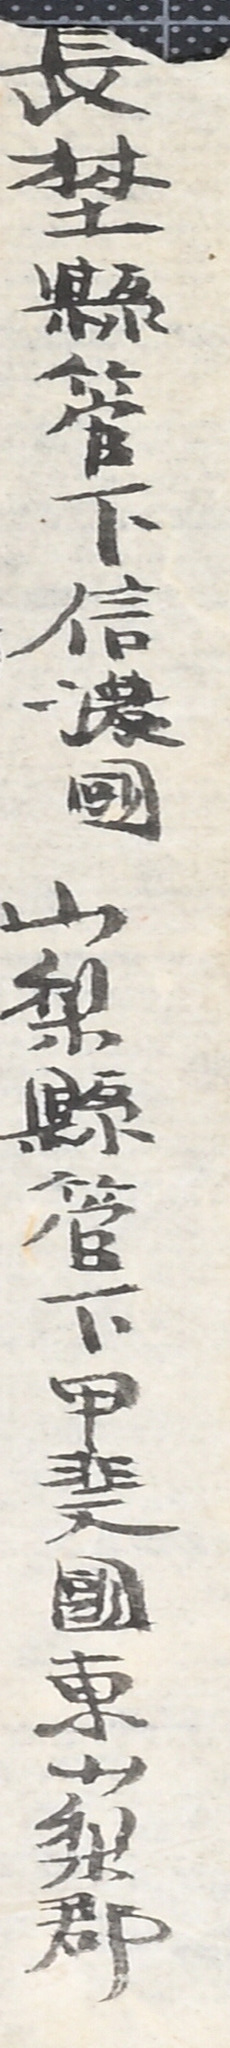「長埜県管下信濃国山梨県管下甲斐国東山梨郡
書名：（書状）
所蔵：伊那市立高遠町図書館・合同会社AMANE
